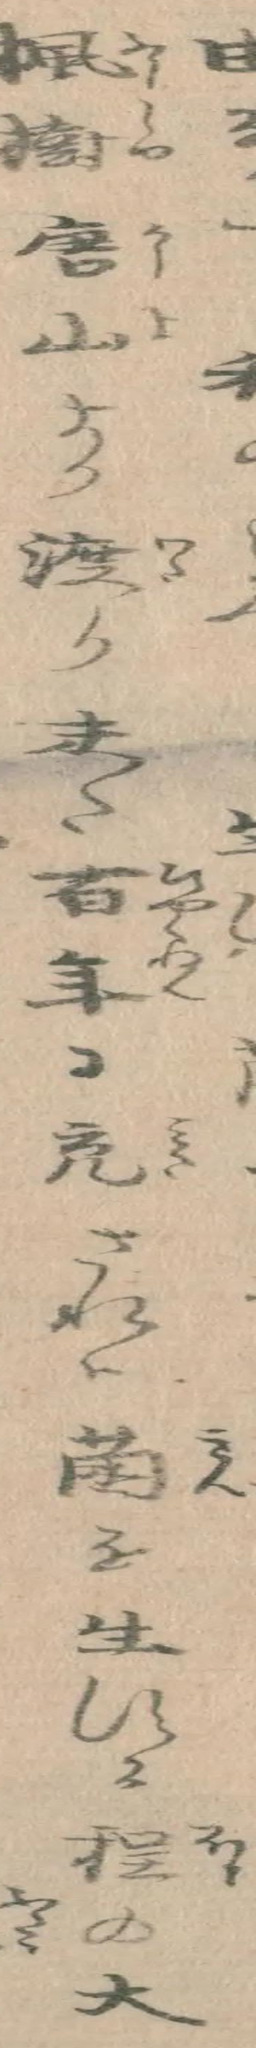楓樹唐山より渡り未た百年に充されは菌を生する程の大
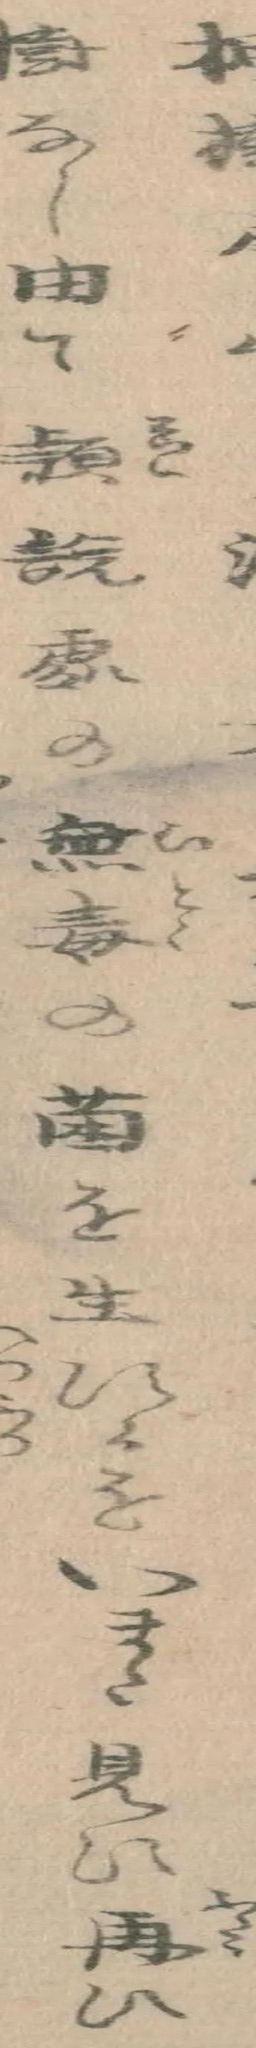樹なし由て穎説処の無毒の菌を生するをいまた見す再ひ
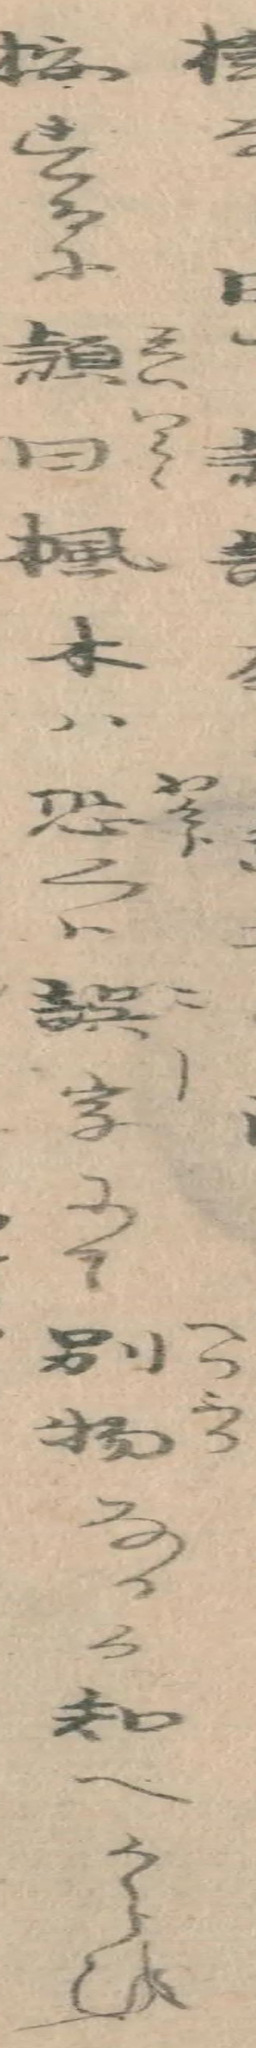按するに穎曰楓木は恐くは誤字にて別物なるか知へからす
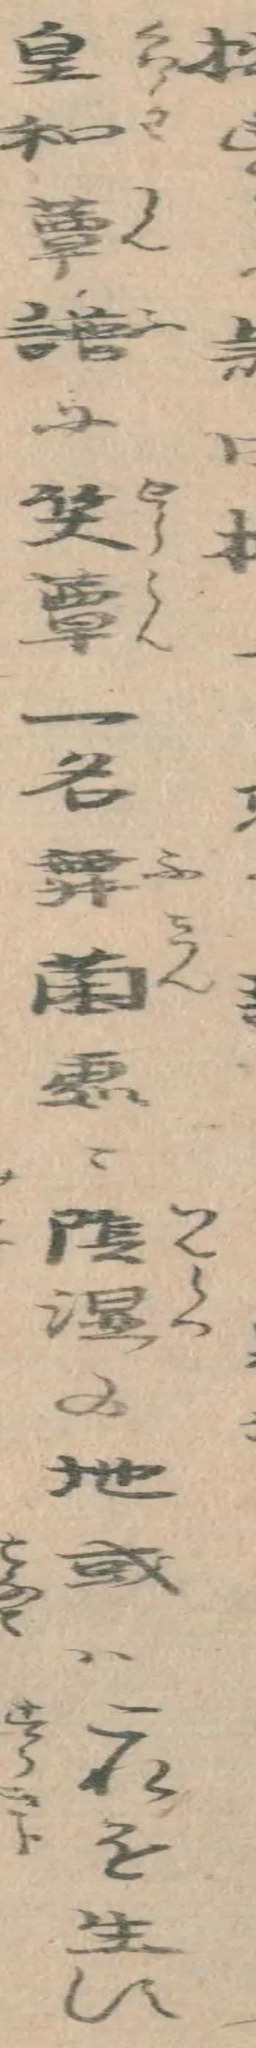皇和蕈譜に笑蕈一名舞菌処〻陰湿の地或はこれを生す
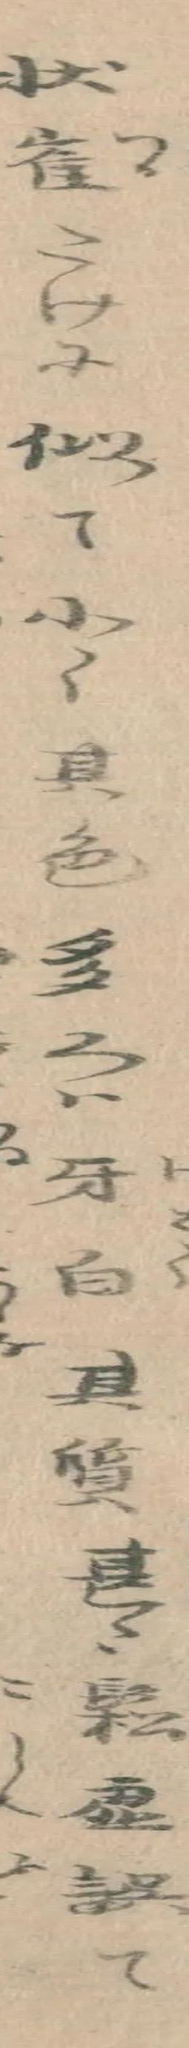状たけに似て小く其色多くは牙白其質甚た鬆虚誤て
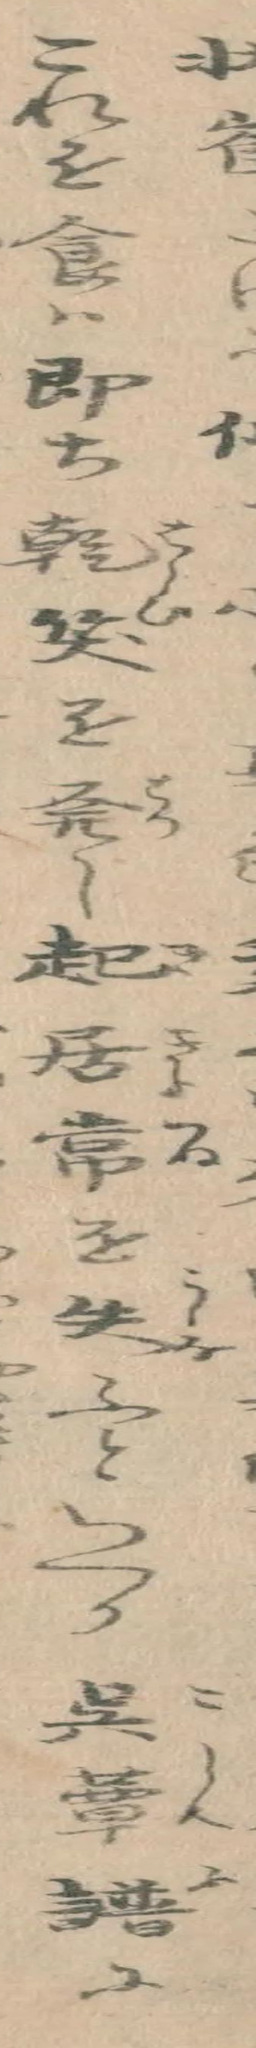これを食は即ち乾笑を発し起居常を失ふといへり呉蕈譜に

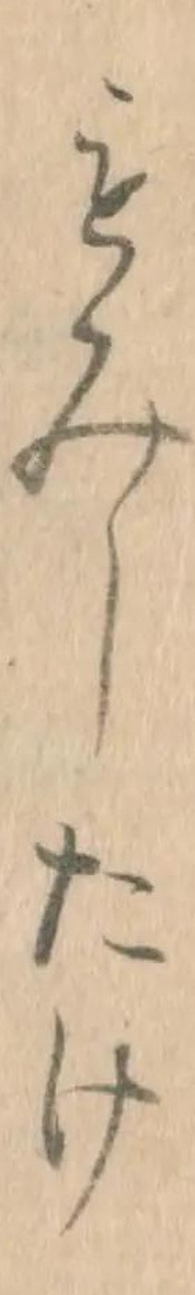もみしたけ
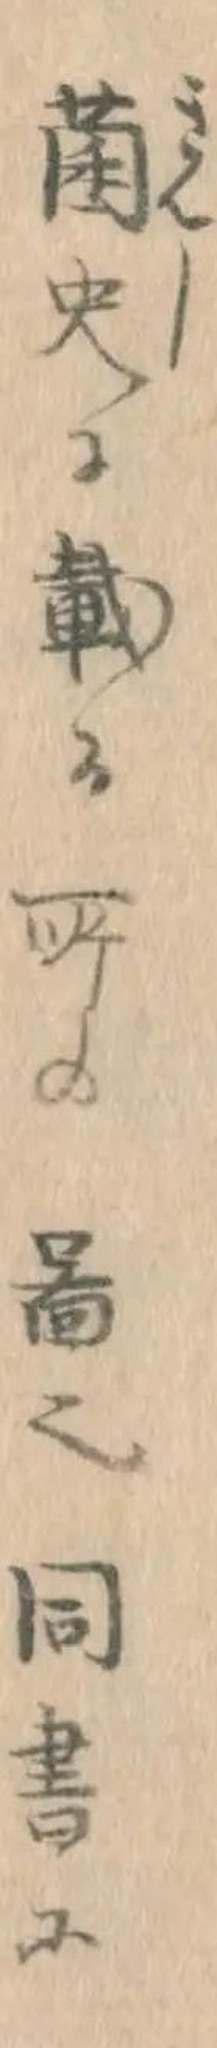菌史に載る所の図也同書に
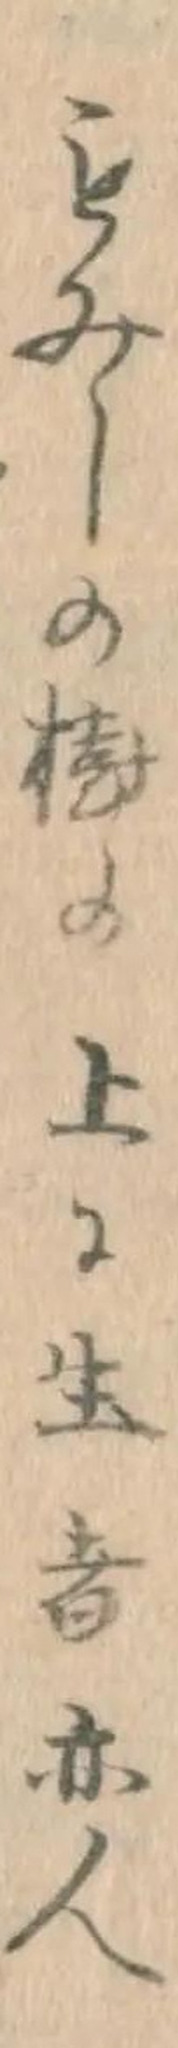もみしの樹の上に生者亦人
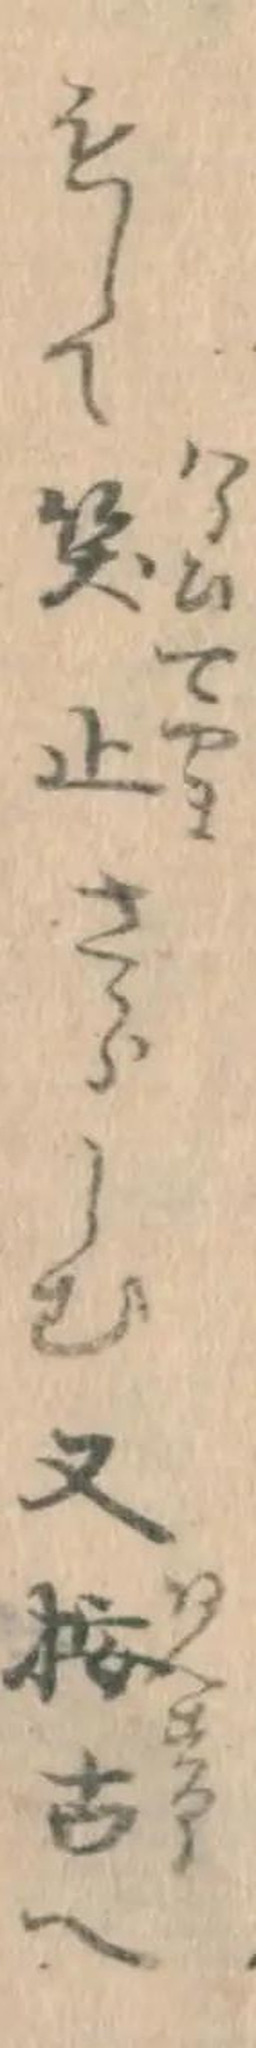をして笑止さらしむ又按古へ
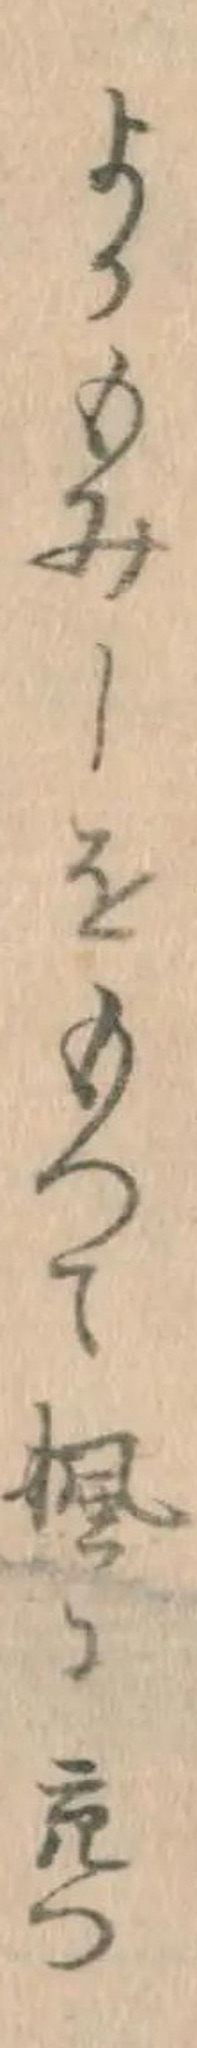よりもみしをもつて楓に充つ
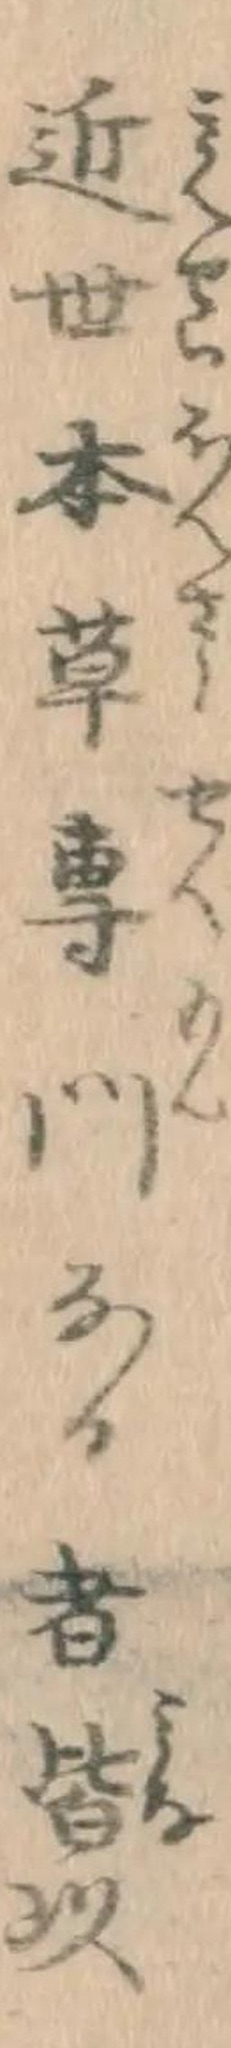近世本草専門なる者皆以
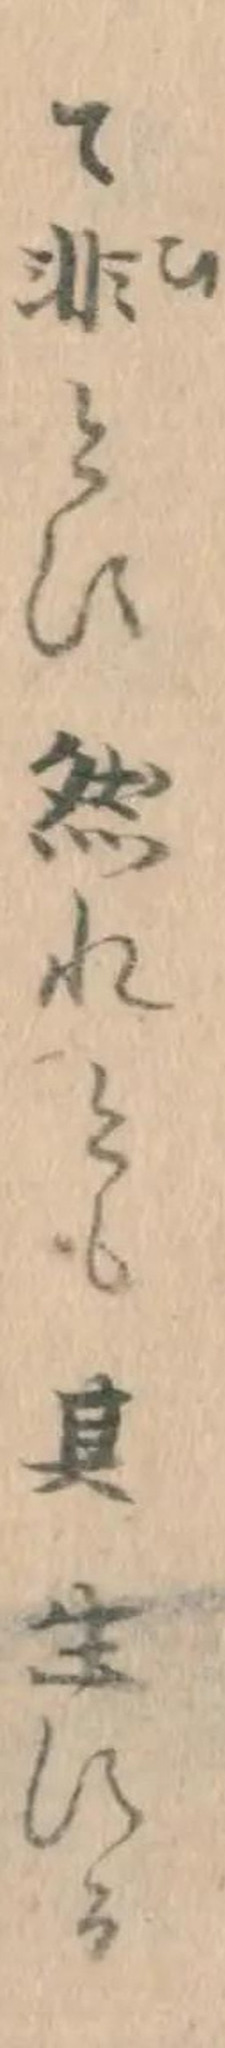て非とす然れとも其生する
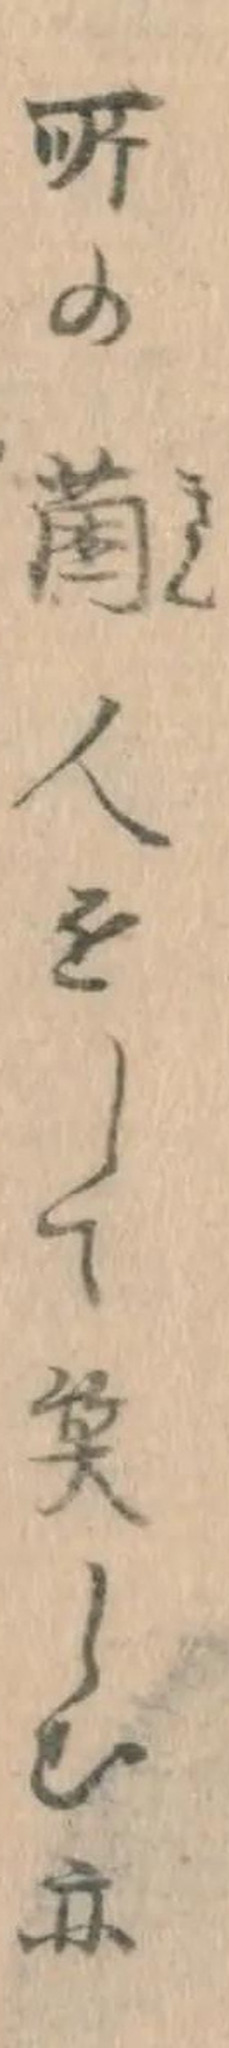所の菌人をして笑しむ亦
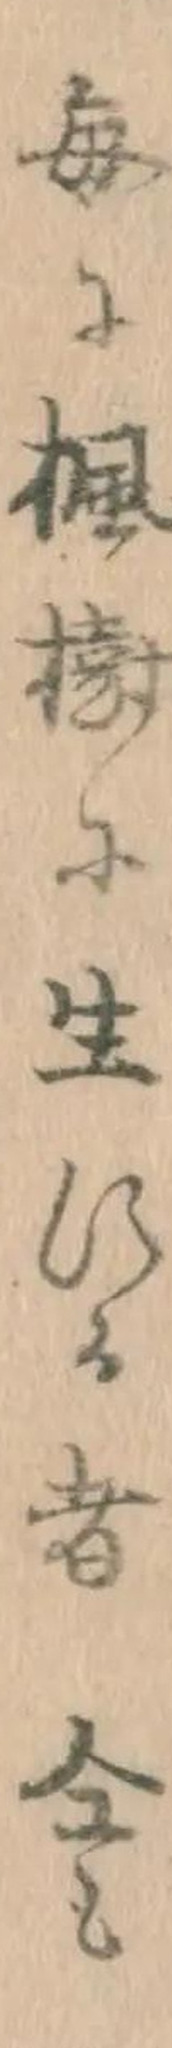毎に楓樹に生する者同も
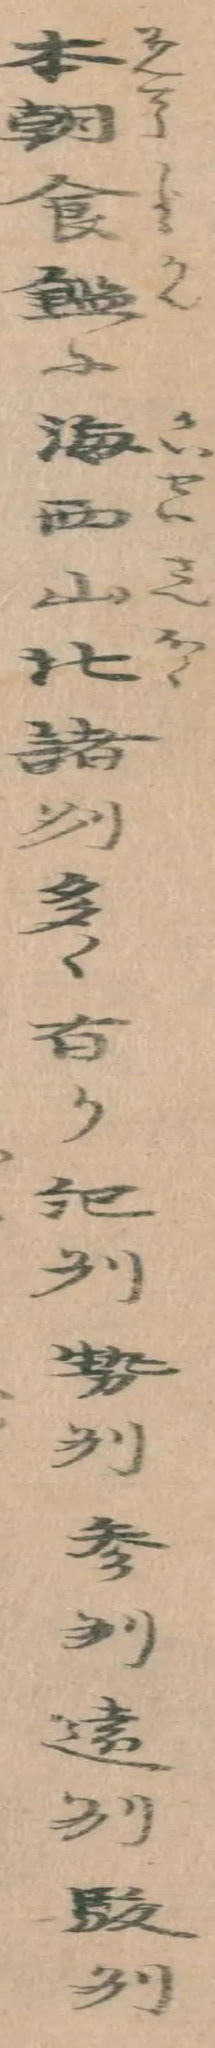本朝食鑑に海西山北諸州多く有り紀州勢州参州遠州駿州
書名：本草図譜. 巻55-57
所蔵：国立国会図書館 National Diet Library, JAPAN
